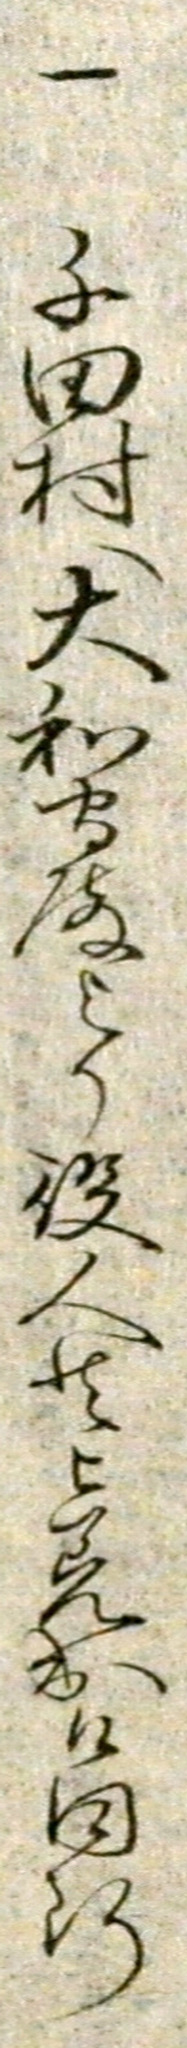一千田村へ大和守殿より役人共被差出候同断
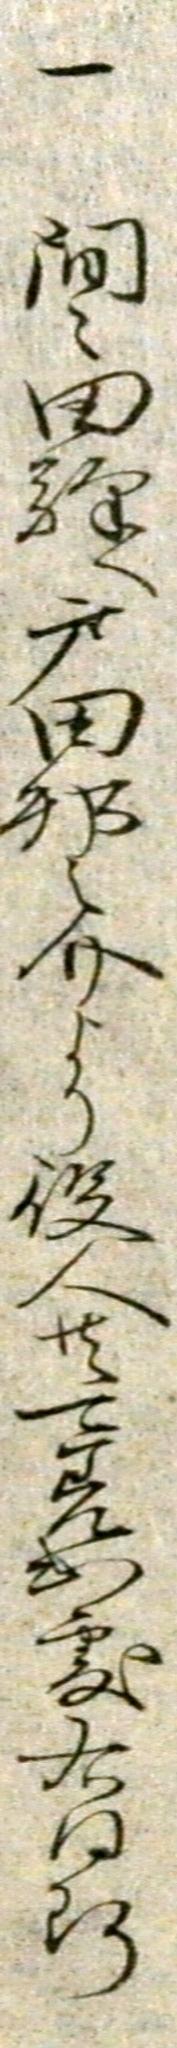一間々田駅へ戸田邦之介より役人共可差出処右同断
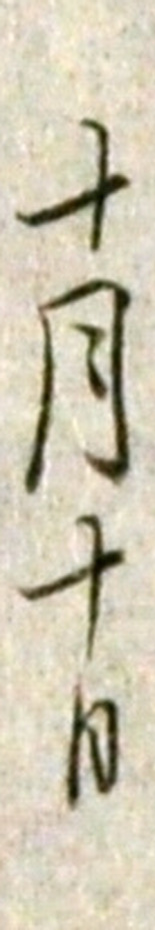十月九日
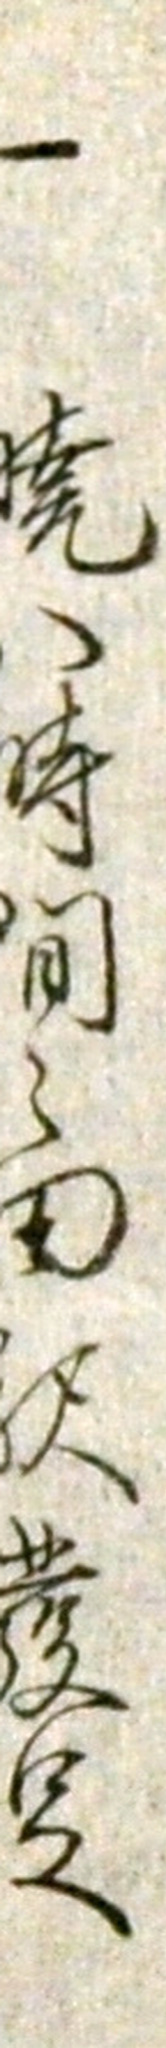一暁八時近徳治郎駅発足

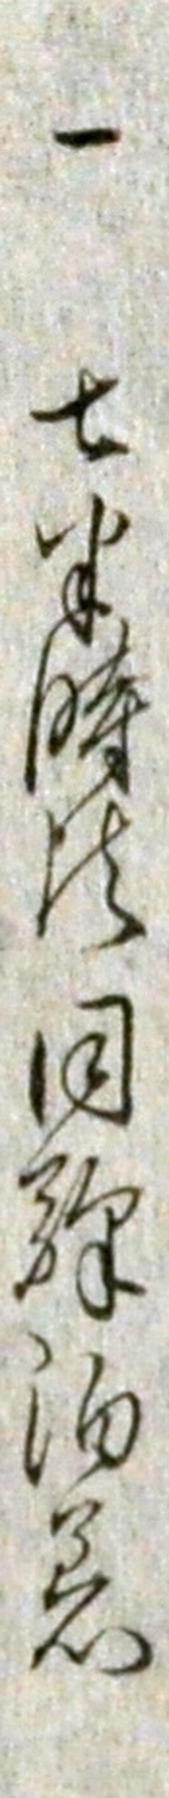一七半時候同駅泊着
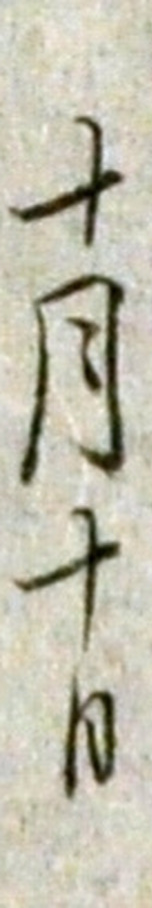十月十日
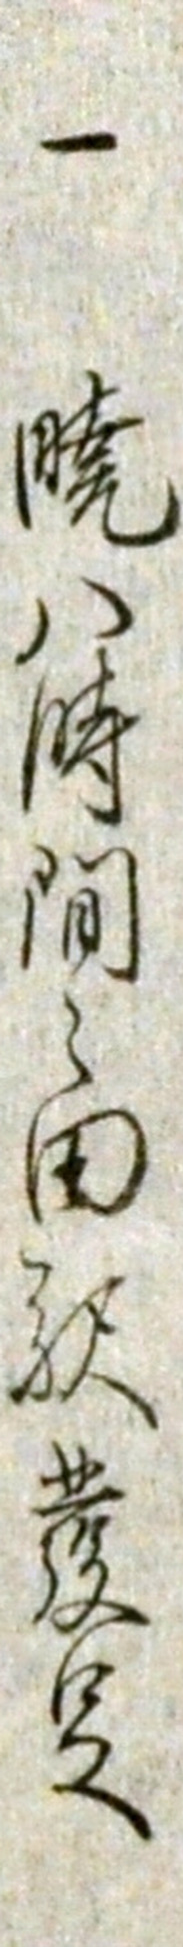一暁八時間々田駅発足
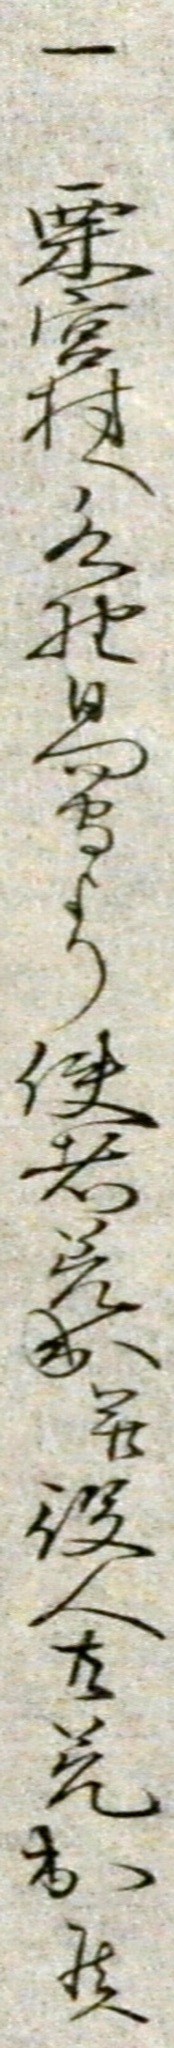一栗宮村へ水野日向守より使者差出幷役人共差出候
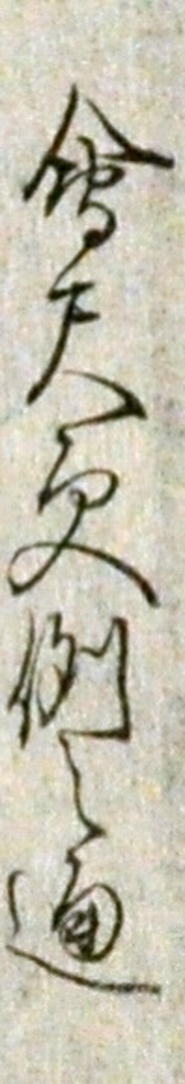会尺受例之通
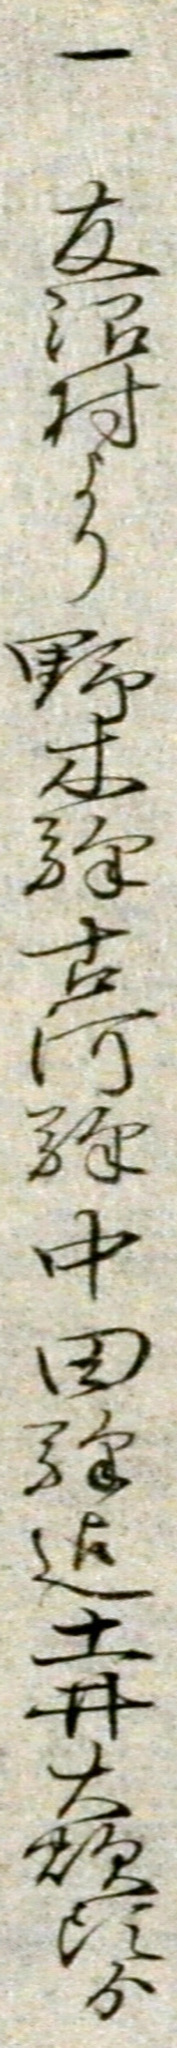一友沼村より野木駅古河駅中田駅迄土井大炊頭ゟ
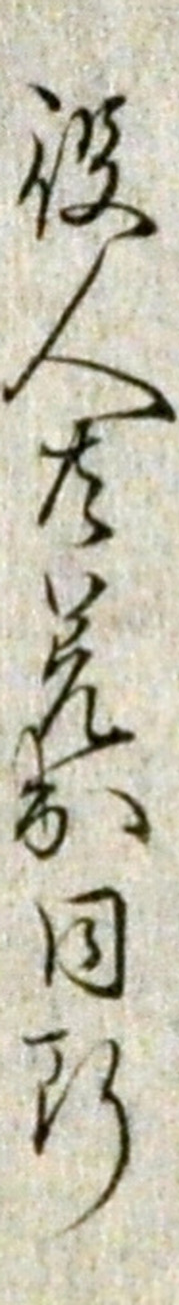役人共差出同断
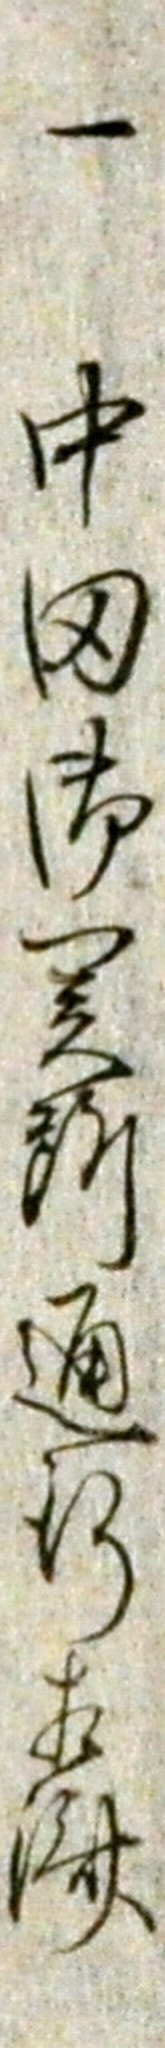一中田御関所通行相済
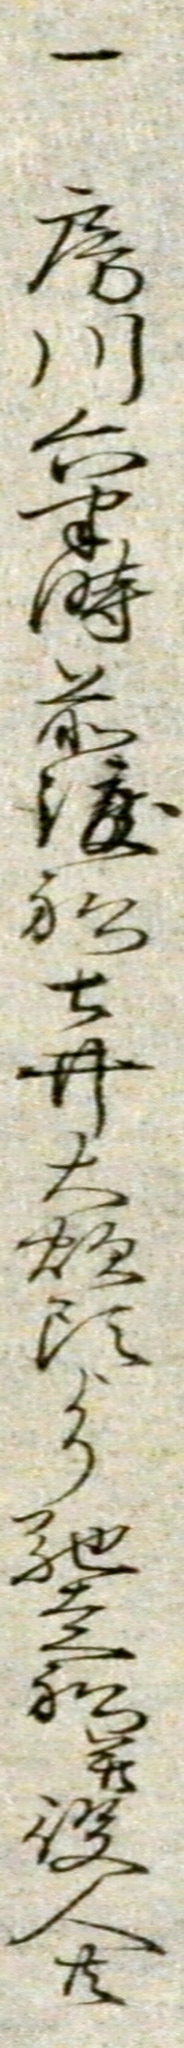一房川六半時前渡船土井大炊頭より馳走船并役人共
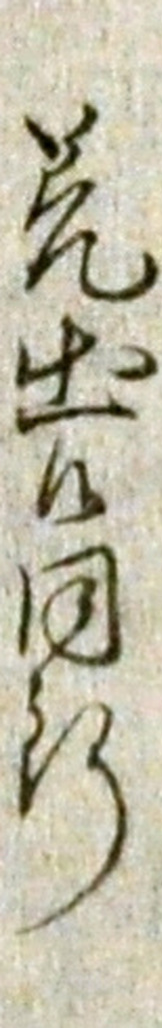差出候同断
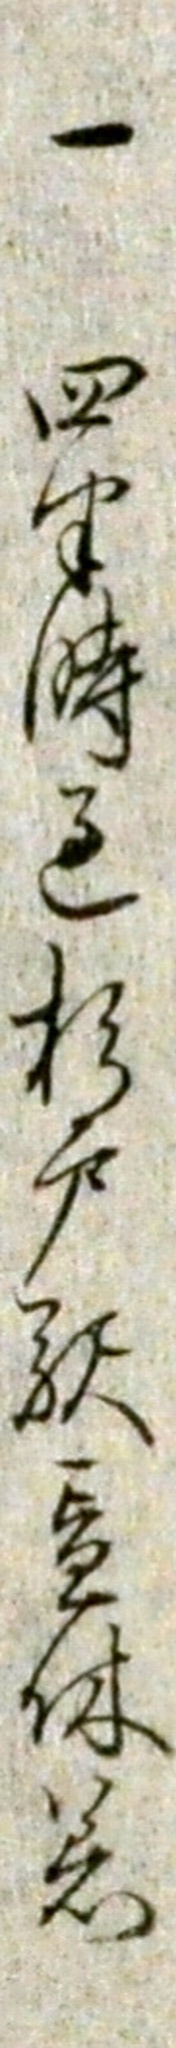一四半時過杉戸駅昼休着
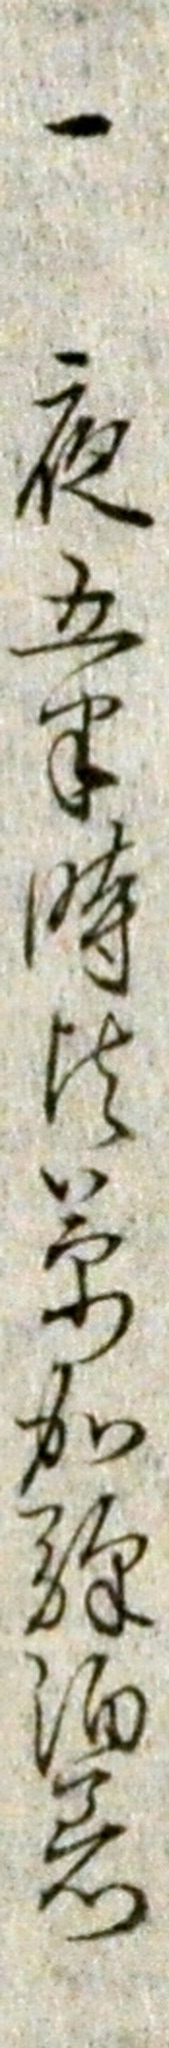一夜五半時頃草加駅泊着
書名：日光御名代相勤候節ノ留
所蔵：伊那市立高遠町図書館・合同会社AMANE
